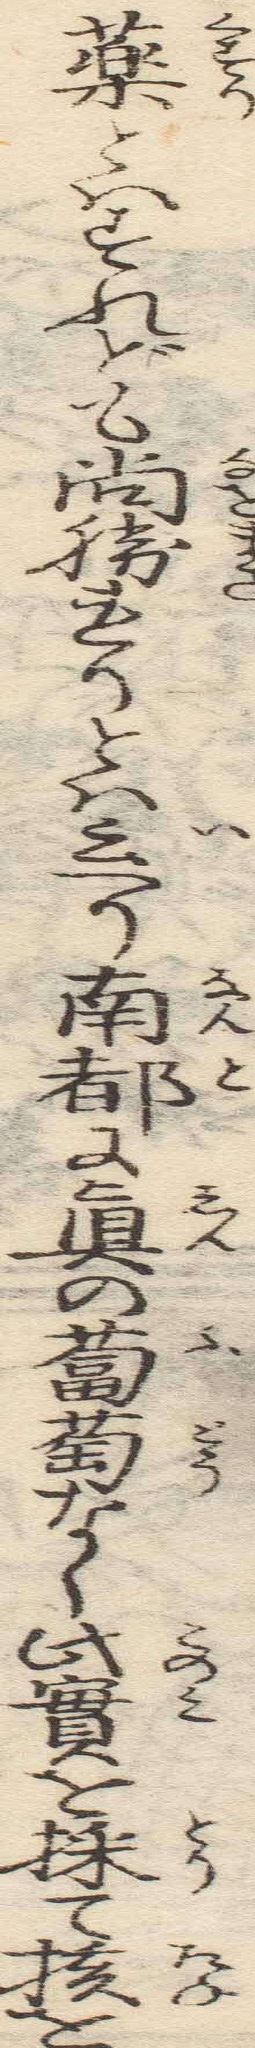薬とはすれども尚勝れりとは云へり南都に真の葡萄なし此実を採て核を
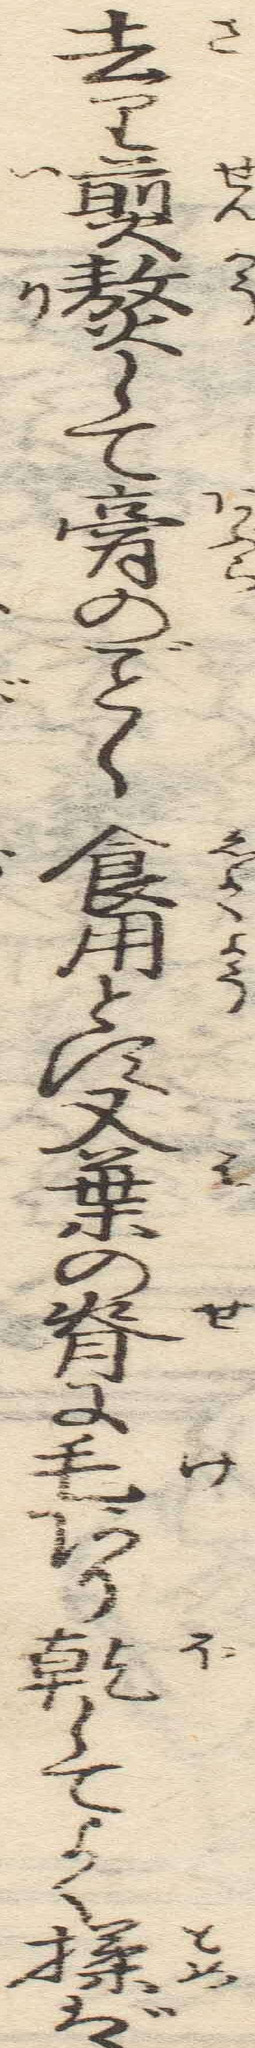去り煎熬して膏のごとし食用とす又葉の脊に毛あり乾してよく揉ば
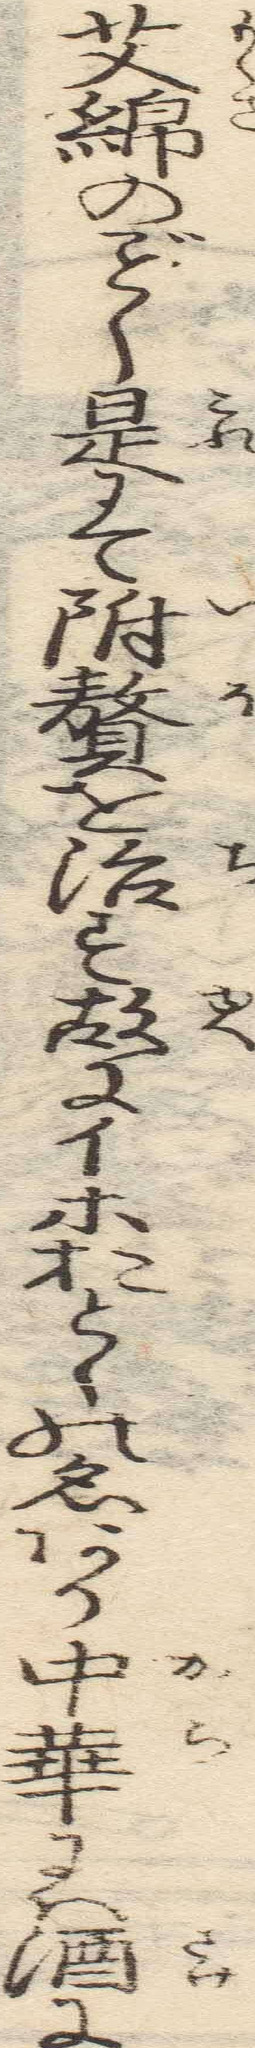艾綿のごとし是にて附贅を治す故にイホおとしの名あり中華には酒に
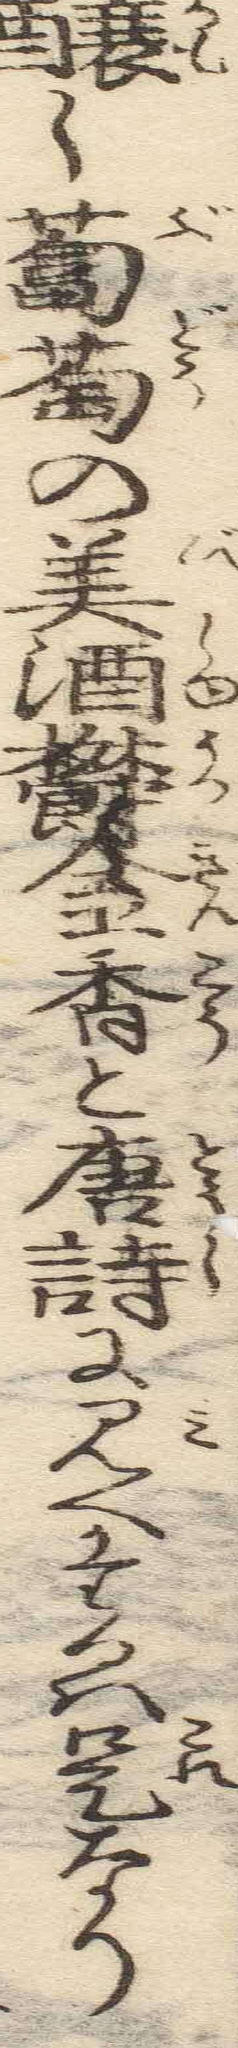醸し葡萄の美酒欝金香と唐詩に見へたるは是なり
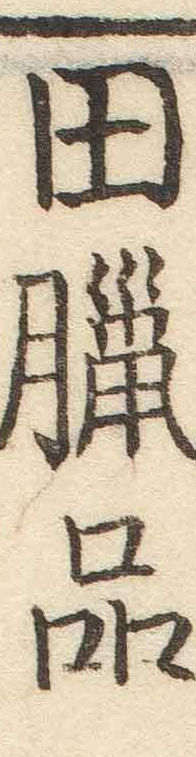田臘品
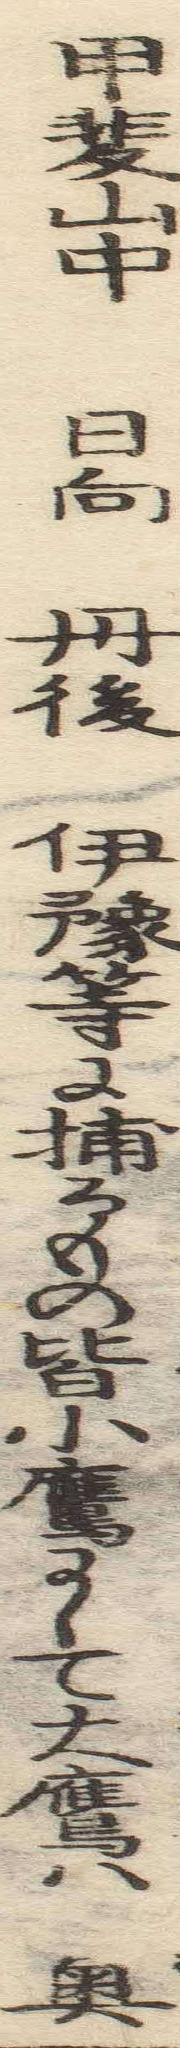甲斐山中日向丹後伊予等に捕るもの皆小鷹にして大鷹は奧
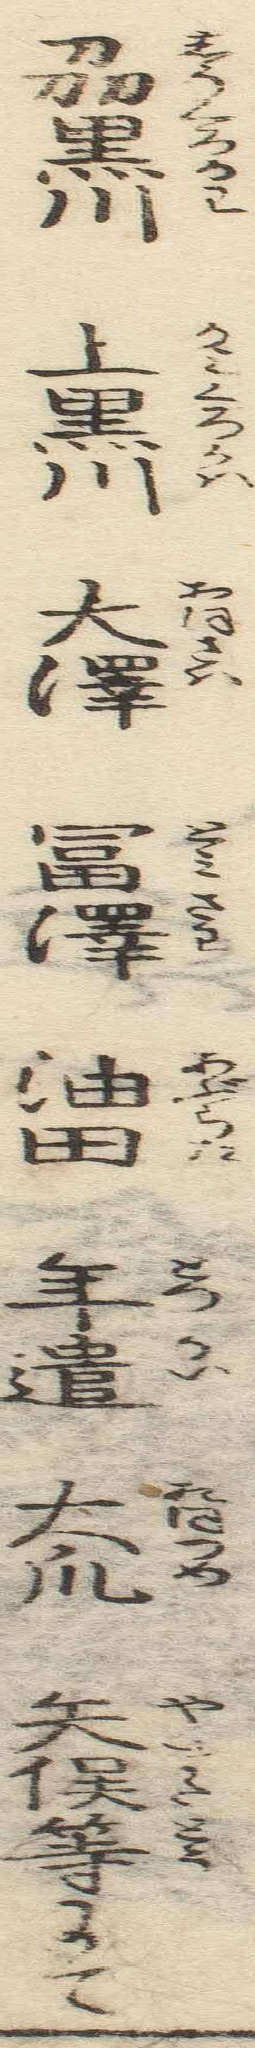州黒川上黒川大沢富沢油田年遣大爪矢俣等にて
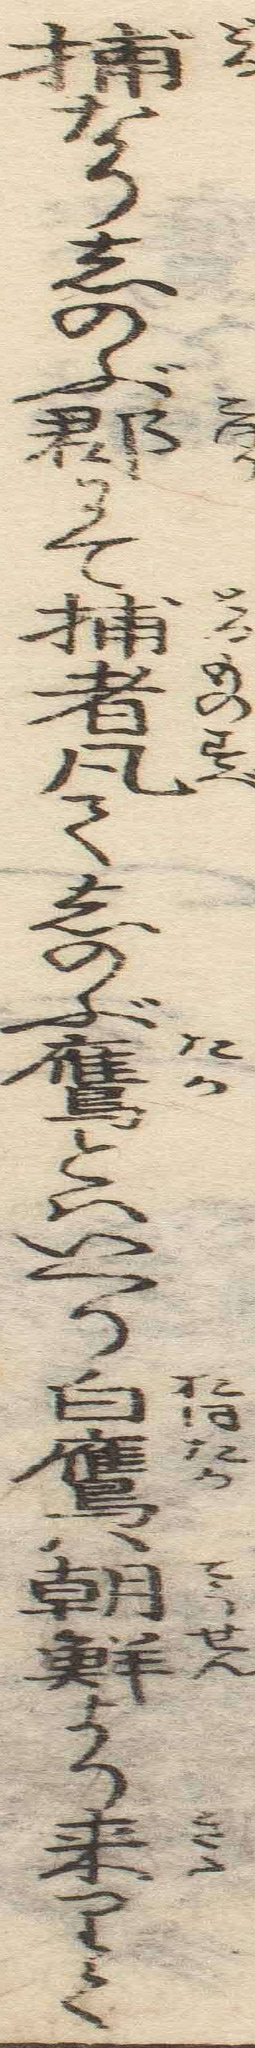捕なりしのぶ郡にて捕者凡てしのぶ鷹とはいへり白鷹は朝鮮より来りて
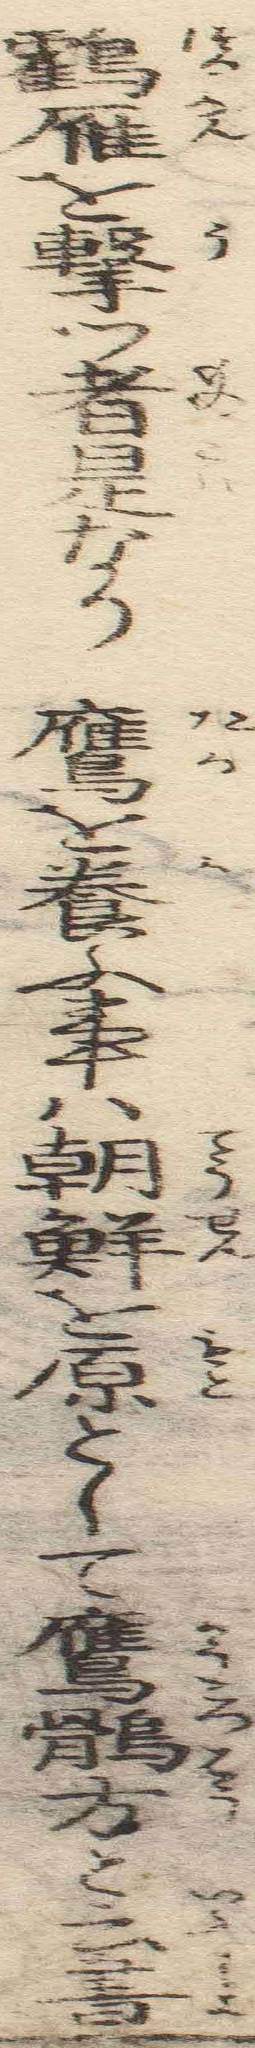鶴雁を撃つ者是なり鷹を養ふ事は朝鮮を原として鷹鶻方と云書
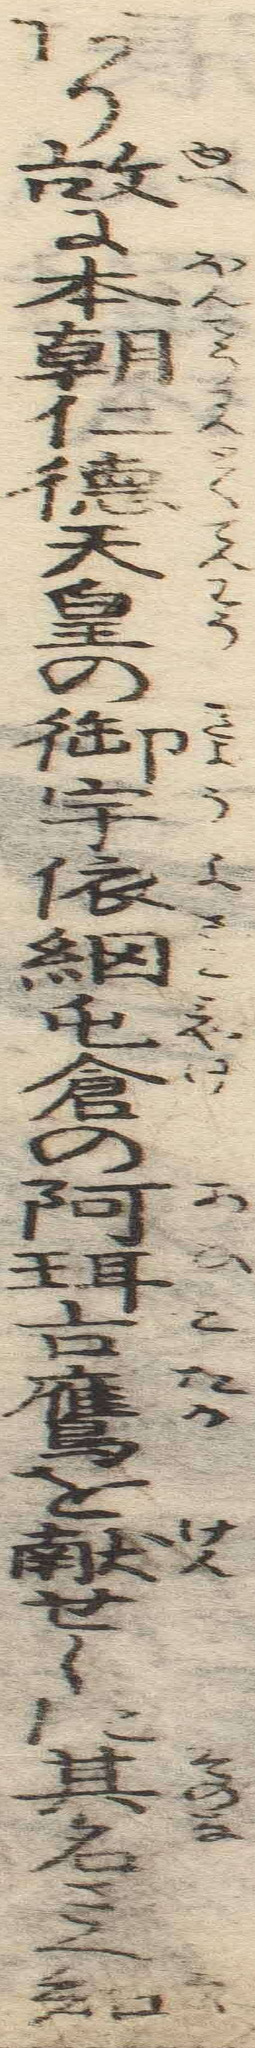あり故に本朝仁徳天皇の御宇依網屯倉の阿珥古鷹を献せしに其名さへ知
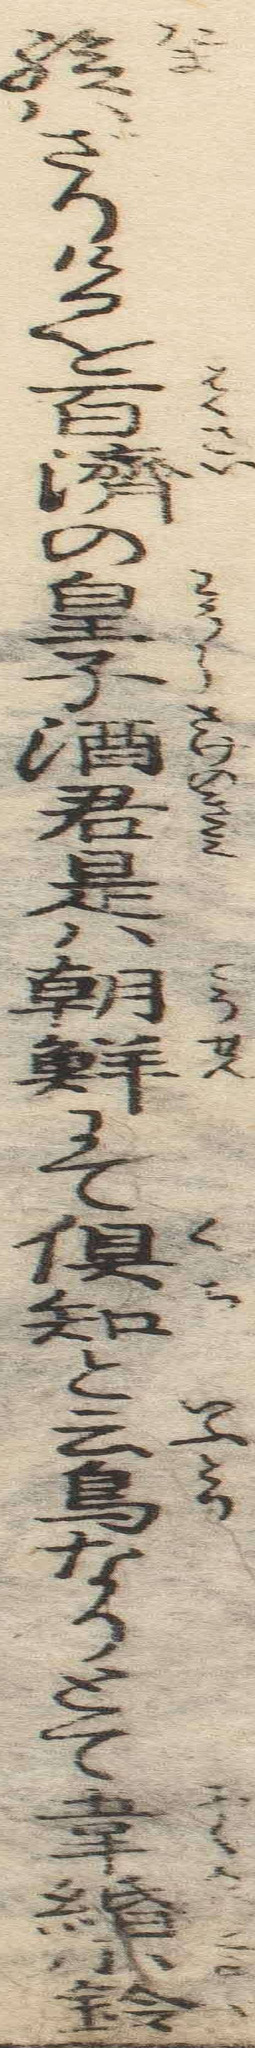給はざりけるを百済の皇子酒君是は朝鮮にて倶知と云鳥なりとて韋緡小鈴
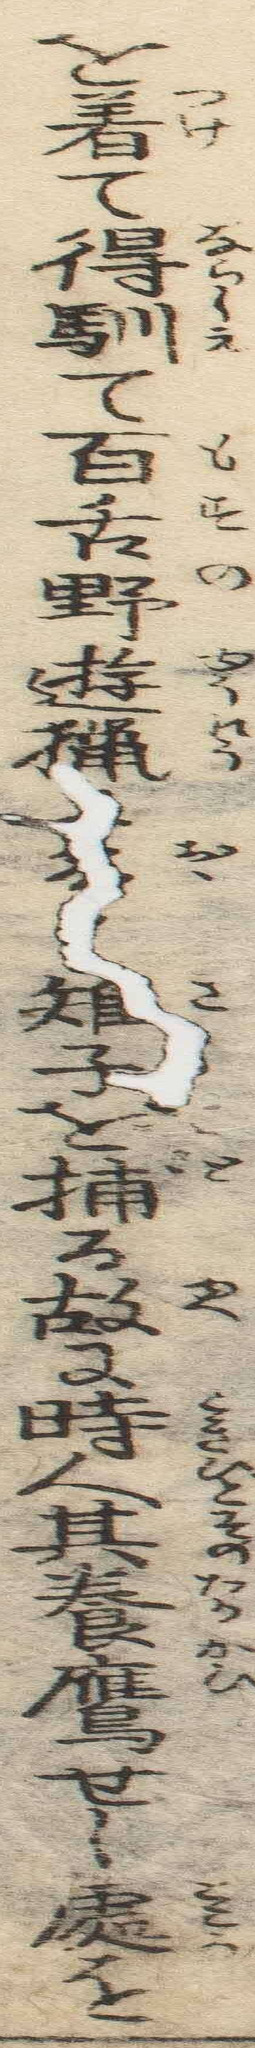を着て得馴て百舌野遊猟雉子きを捕る故に時人其養鷹せし処を
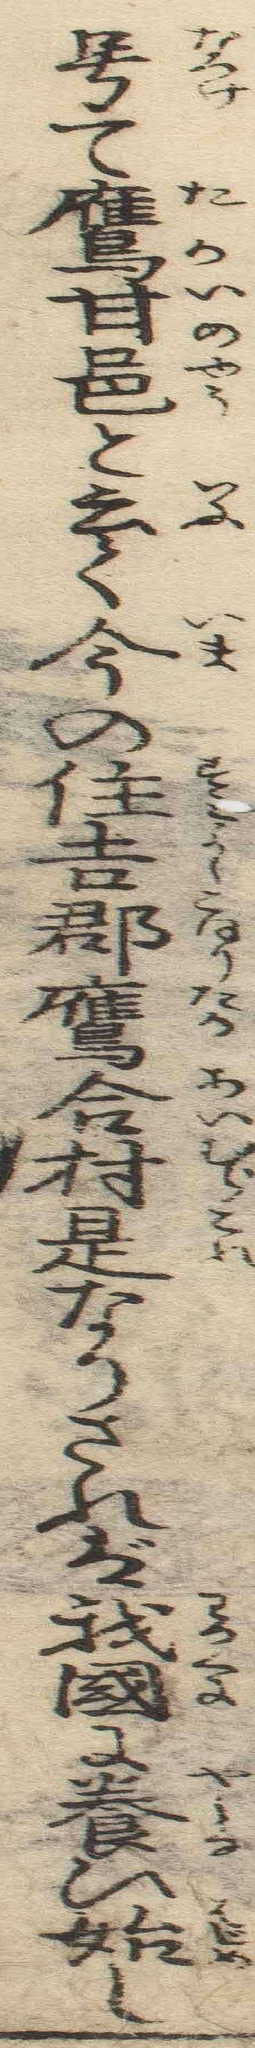号て鷹甘邑と云て今の住吉郡鷹合村是なりされば我国に養ひ始し

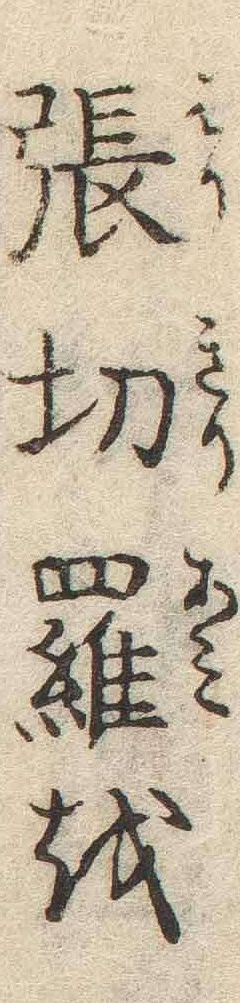張切羅を
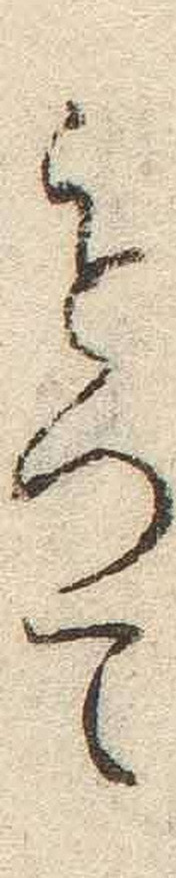もつて
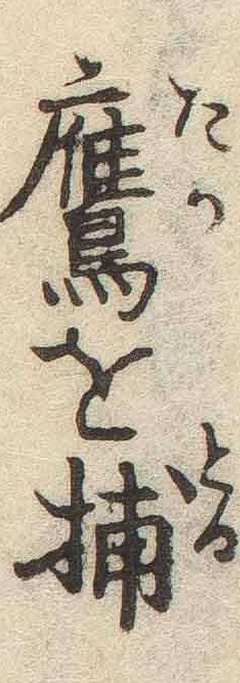鷹を捕
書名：日本山海名産図会
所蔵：東京学芸大学附属図書館 国文学研究資料館
